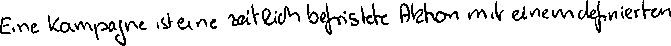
Eine Kampagne ist eine zeitlich befristete Aktion mit einem definierten
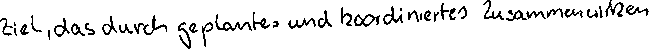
Ziel, das durch geplantes und koordiniertes Zusammenwirken
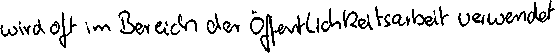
wird oft im Bereich der Öffentlichkeitsarbeit verwendet
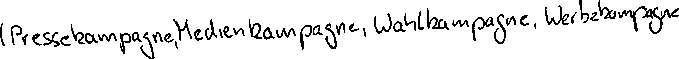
(Pressekampagne, Medienkampagne, Wahlkampagne, Werbekampagne
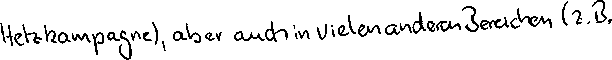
Hetzkampagne), aber auch in vielen anderen Bereichen (z. B.
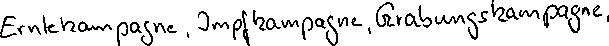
Erntekampagne, Impfkampagne, Grabungskampagne,
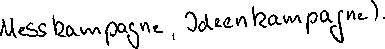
Messkampagne, Ideenkampagne).
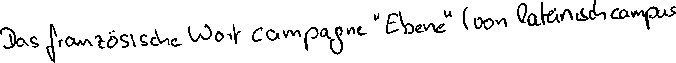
Das französische Wort campagne "Ebene" (von lateinisch campus
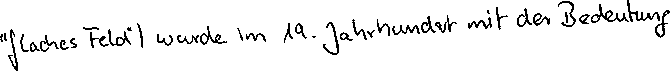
"flaches Feld") wurde im 19. Jahrhundert mit der Bedeutung
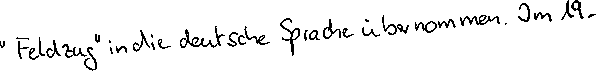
"Feldzug" in die deutsche Sprache übernommen. Im 19.
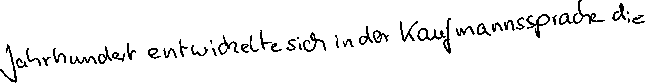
Jahrhundert entwickelte sich in der Kaufmannssprache die
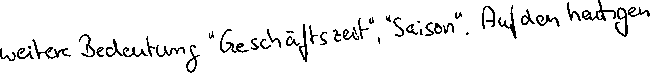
weitere Bedeutung "Geschäftszeit", "Saison". Auf den heutigen
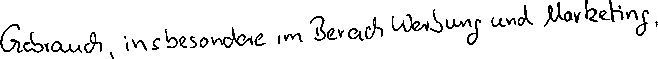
Gebrauch, insbesondere im Bereich Werbung und Marketing,
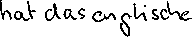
hat das englische
